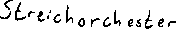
Streichorchester
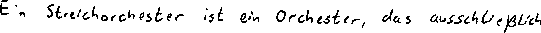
Ein Streichorchester ist ein Orchester, das ausschließlich
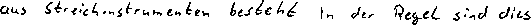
aus Streichinstrumenten besteht. In der Regel sind dies
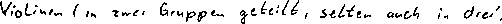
Violinen (in zwei Gruppen geteilt, selten auch in drei,
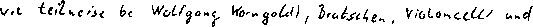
wie teilweise bei Wolfgang Korngold), Bratschen, Violoncelli und
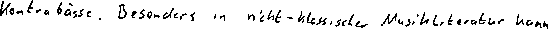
Kontrabässe. Besonders in nicht-klassischer Musikliteratur kann
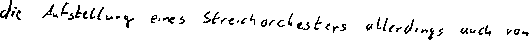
die Aufstellung eines Streichorchesters allerdings auch von
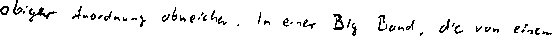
obiger Anordnung abweichen. In einer Big-Band, die von einem
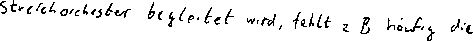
Streichorchester begleitet wird, fehlt z. B. häufig die
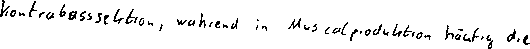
Kontrabasssektion, während in Musicalproduktionen häufig die
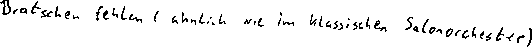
Bratschen fehlen (ähnlich wie im klassischen Salonorchester)
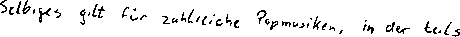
Selbiges gilt für zahlreiche Popmusiken, in der teils
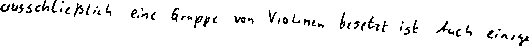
ausschließlich eine Gruppe von Violinen besetzt ist. Auch einige
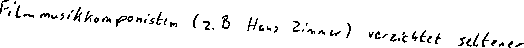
Filmmusikkomponisten (z. B. Hans Zimmer) verzichten seltener
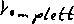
komplett
